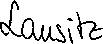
Lausitz
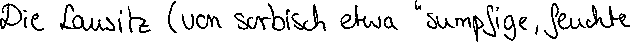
Die Lausitz (von sorbisch etwa "sumpfige, feuchte
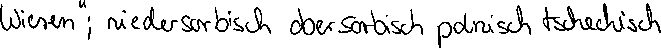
Wiesen"; niedersorbisch obersorbisch polnisch tschechisch
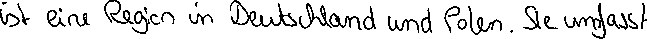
ist eine Region in Deutschland und Polen. Sie umfasst
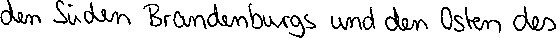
den Süden Brandenburgs und den Osten des
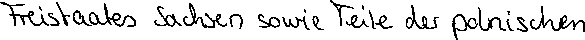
Freistaates Sachsen sowie Teile der polnischen
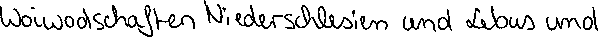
Woiwodschaften Niederschlesien und Lebus und
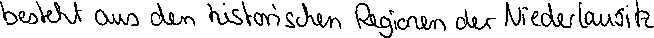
besteht aus den historischen Regionen der Niederlausitz
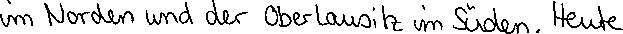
im Norden und der Oberlausitz im Süden. Heute
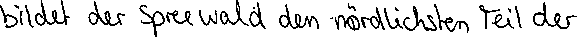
bildet der Spreewald den nördlichsten Teil der
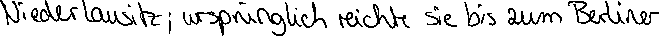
Niederlausitz; ursprünglich reichte sie bis zum Berliner
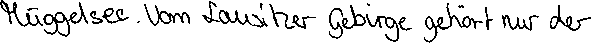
Müggelsee. Vom Lausitzer Gebirge gehört nur der
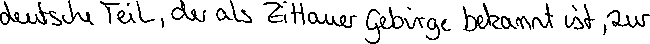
deutsche Teil, der als Zittauer Gebirge bekannt ist, zur
